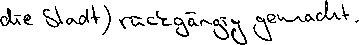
die Stadt) rückgängig gemacht,
